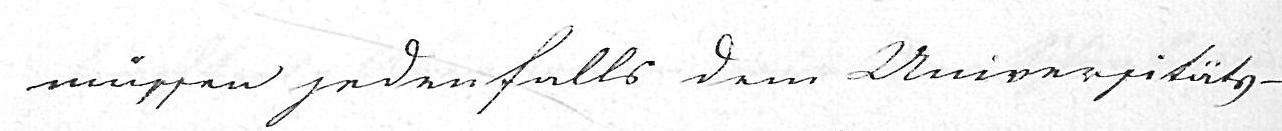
müssen jedenfalls dem Universitäts-
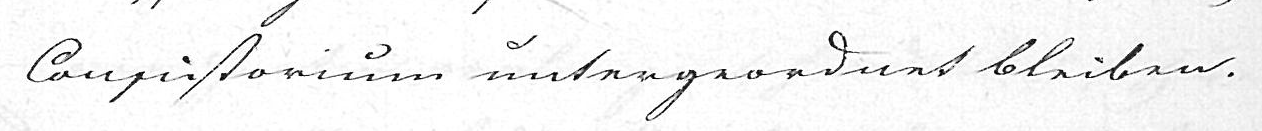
Consistorium untergeordnet bleiben.
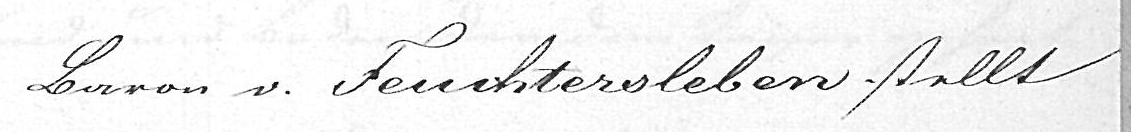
Baron v. Feuchtersleben stellt
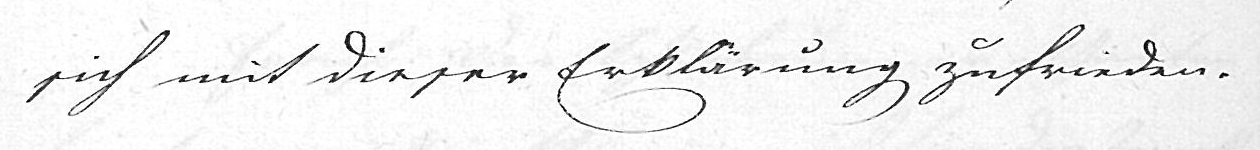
sich mit dieser Erklärung zufrieden.
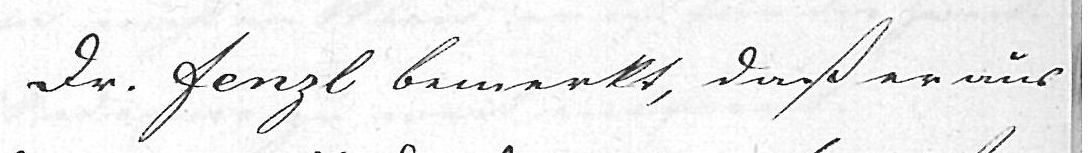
Dr. Fenzl bemerkt, daß er aus
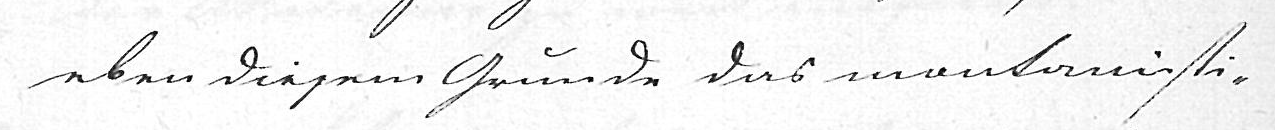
eben diesem Grunde das montaninsti-
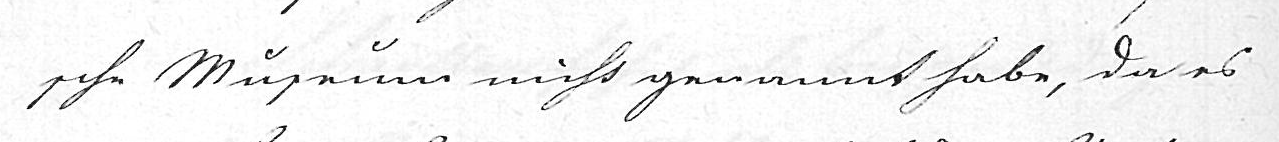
sche Museum nicht genannt habe, da es
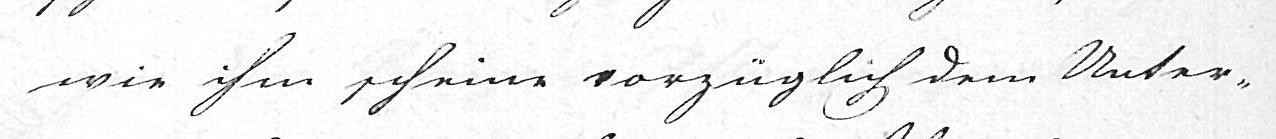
wie ihm scheine vorzüglich dem Unter-
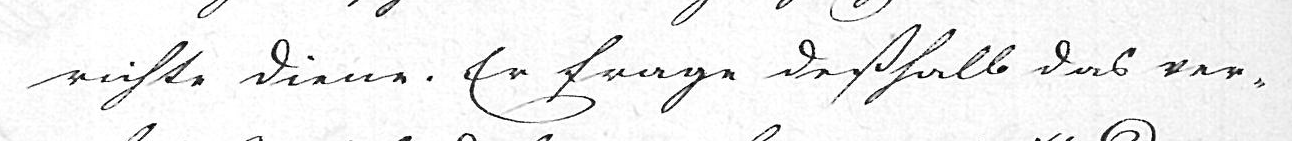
richte diene. Er frage deßhalb das ver-
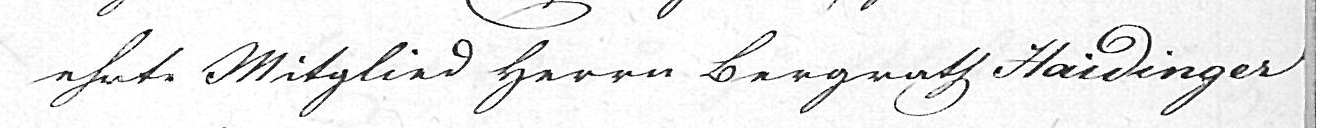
ehrte Mitglied Herrn Bergrath Haidinger
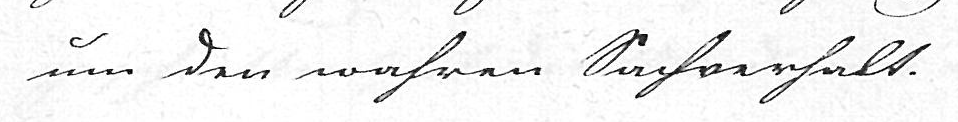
um den wahren Sachverhalt.
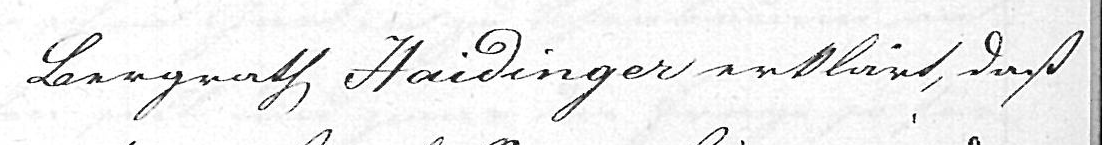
Bergrath Haidinger erklärt, daß
